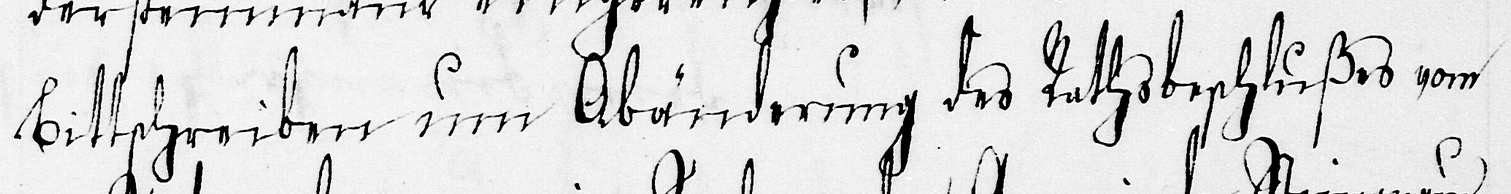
Bittschreiben um Abänderung des Rathsbeschlußes vom
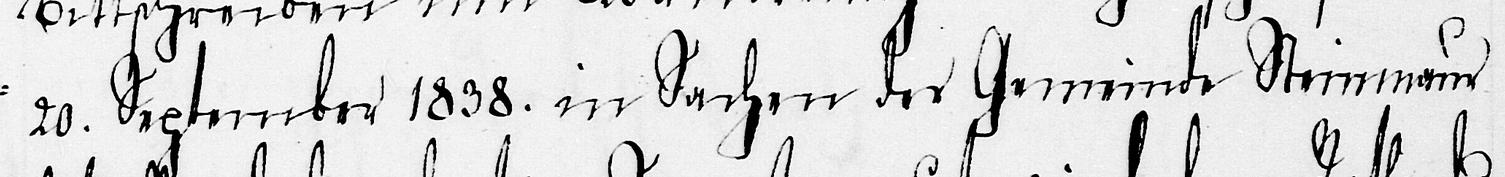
20. September 1838. in Sachen der Gemeinde Steinmaur
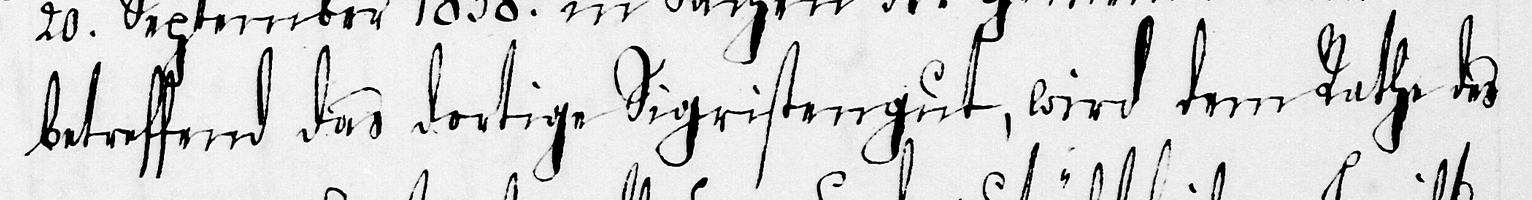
betreffend das dortige Sigristengut, wird dem Rathe des
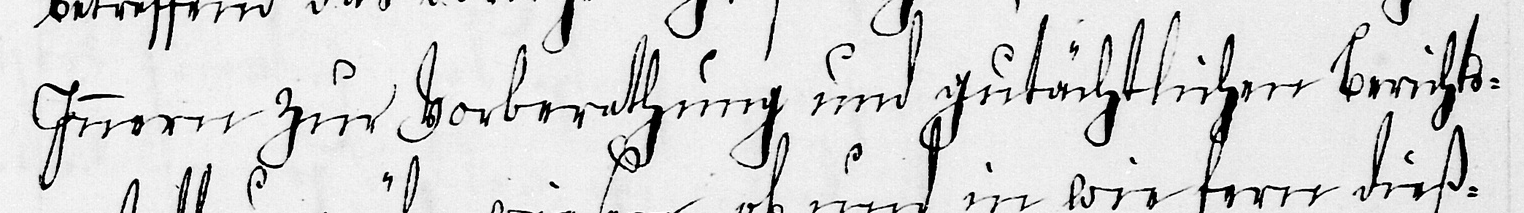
Innern zur Vorberathung und gutächtlichen Berichts¬
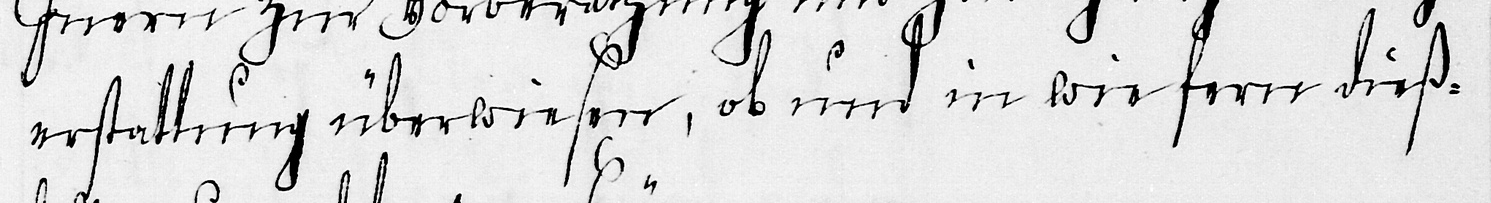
erstattung überwiesen, ob und in wie fern dieß¬
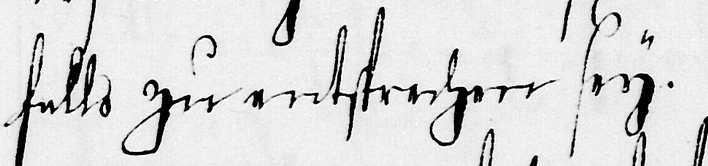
falls zu entsprechen sey.
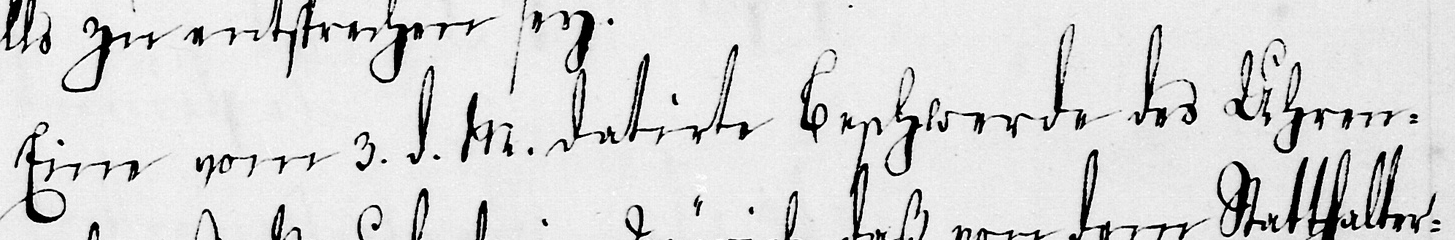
Eine vom 3. d. M. datirte Beschwerde des Uhren¬
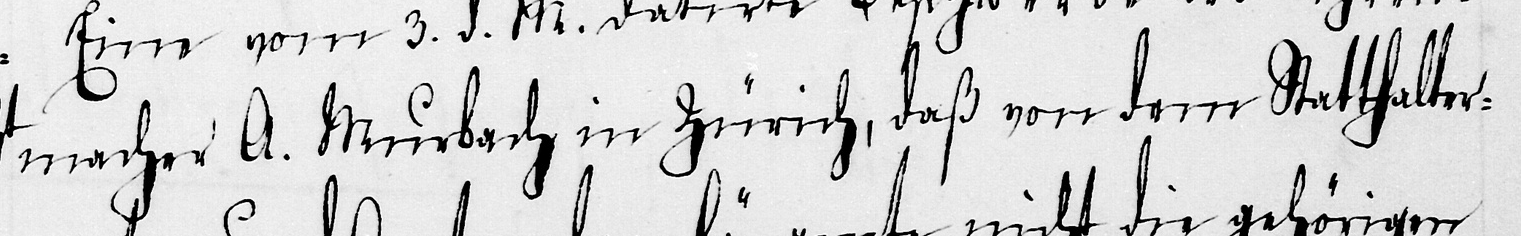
macher A. Murbach in Zürich, daß von dem Statthalter¬
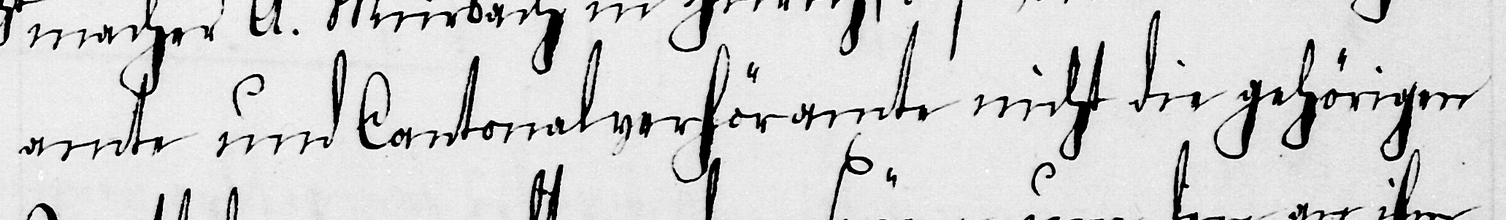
amte und Cantonalverhöramte nicht die gehörigen
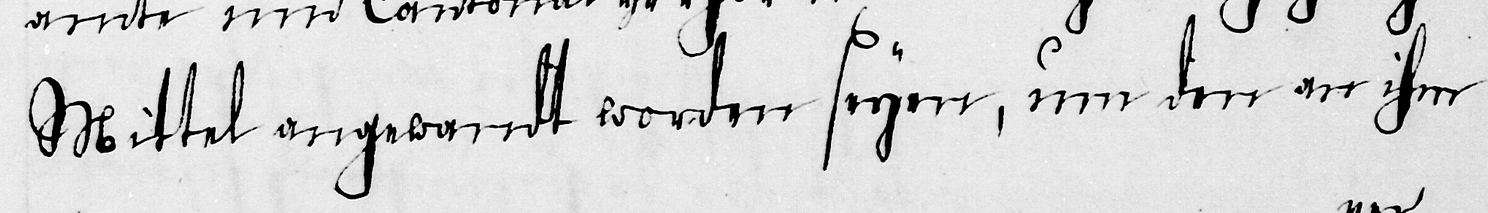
Mittel angewandt worden seyen, um den an ihm
